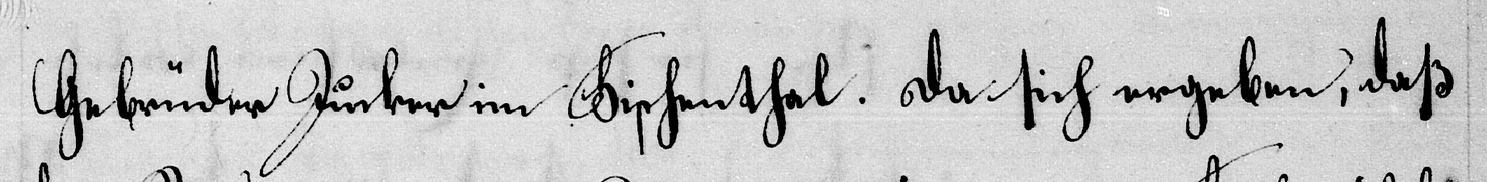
Gebrüder Junker im Fischenthal. Da sich ergeben, daß
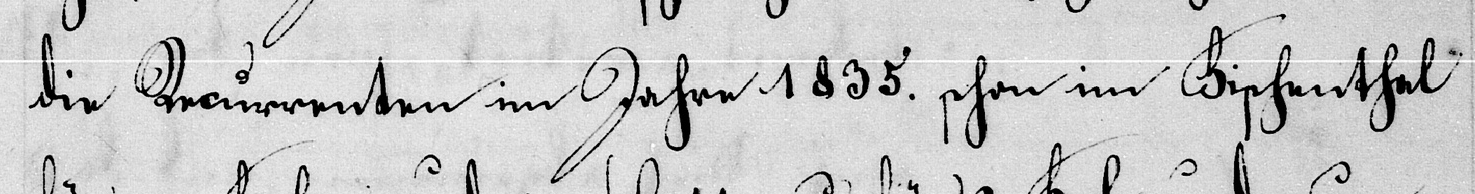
die Recurrenten im Jahre 1835. schon im Fischenthal
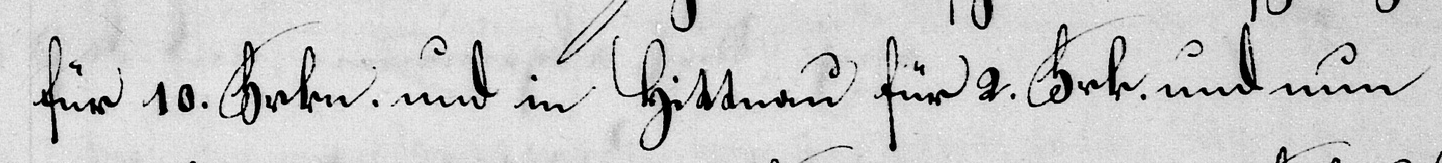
für 10. Frkn. und in Hittnau für 2. Frk. und nun
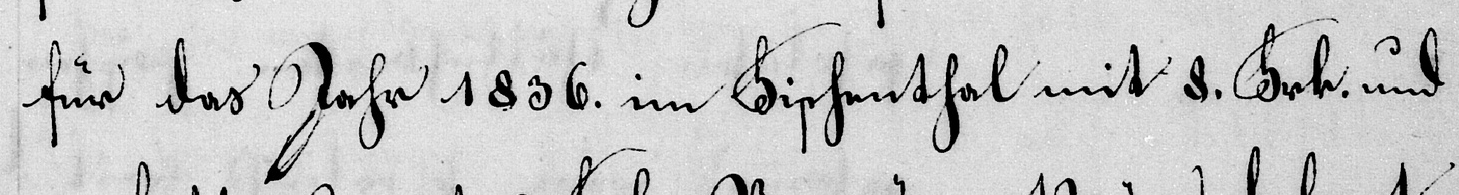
für das Jahr 1836. im Fischenthal mit 8. Frk. und
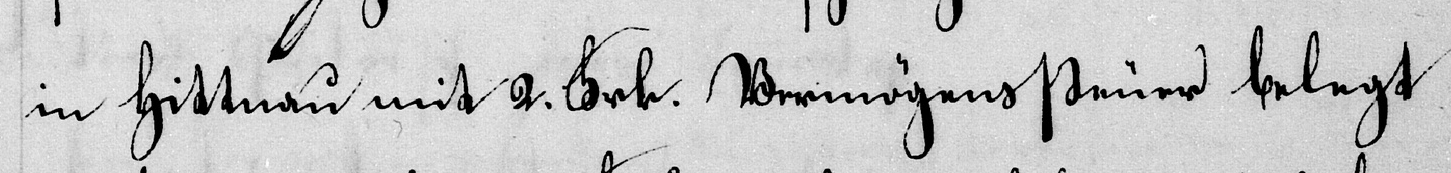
in Hittnau mit 2. Frk. Vermögenssteuer belegt
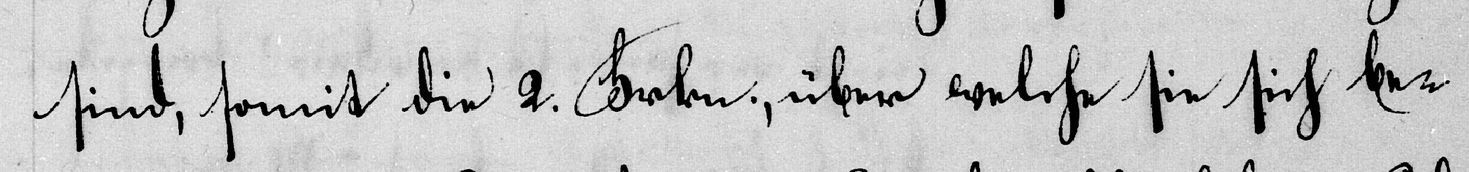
sind, somit die 2. Frkn., über welche sie sich be¬
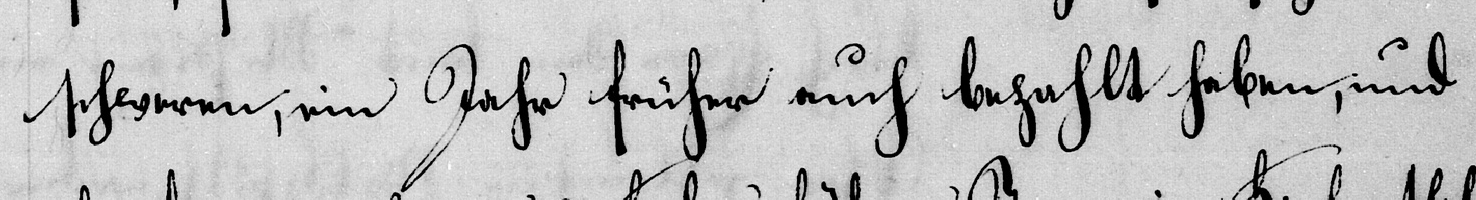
schweren, ein Jahr früher auch bezahlt haben, und
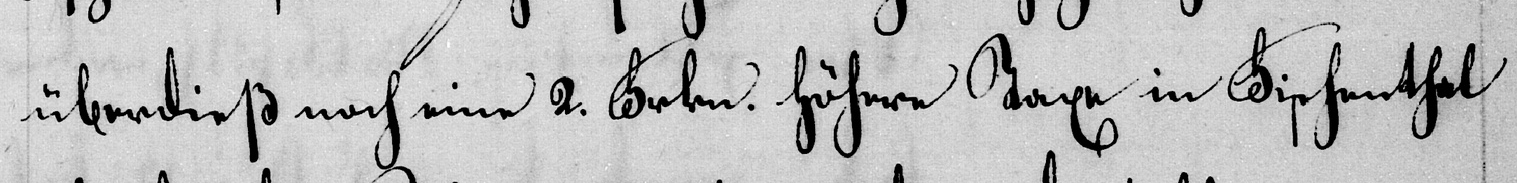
überdieß nach eine 2. Frkn. höhere Taxe in Fischenthal
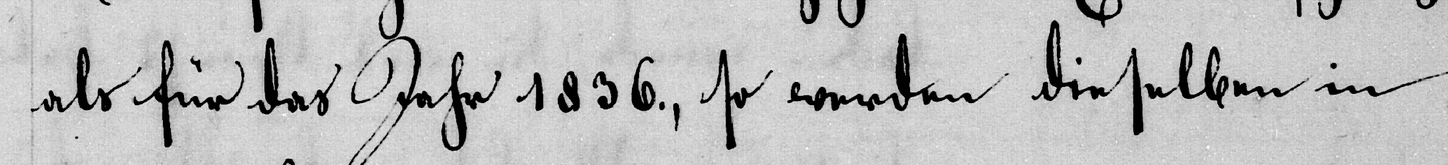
als für das Jahr 1836., so werden dieselben in
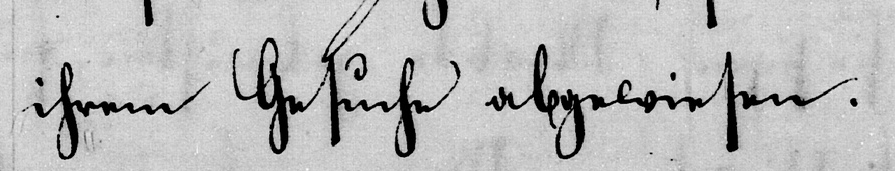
ihrem Gesuche abgewiesen.
